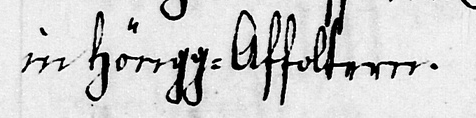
in Höngg-Affoltern.
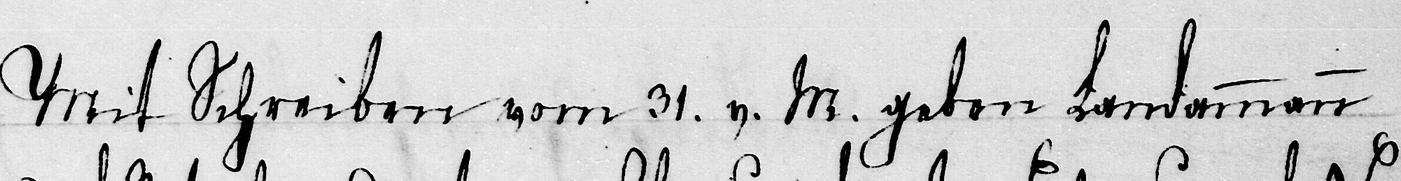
Mit Schreiben vom 31. v. M. geben Landammann
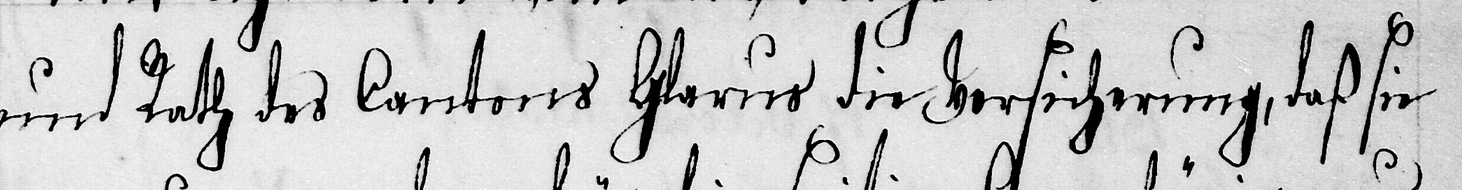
und Rath des Cantons Glarus die Versicherung, daß sie
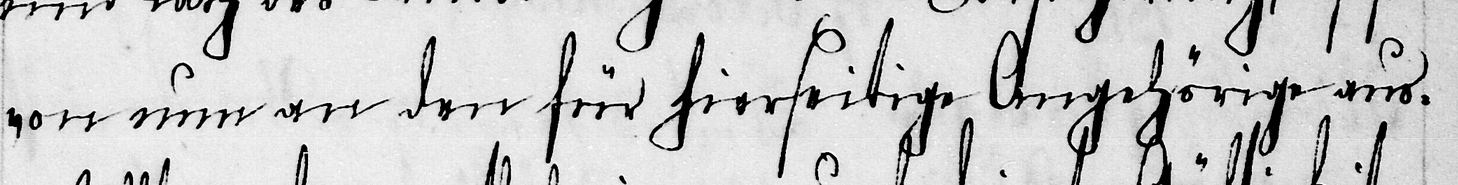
von nun an den für hierseitige Angehörige aus¬
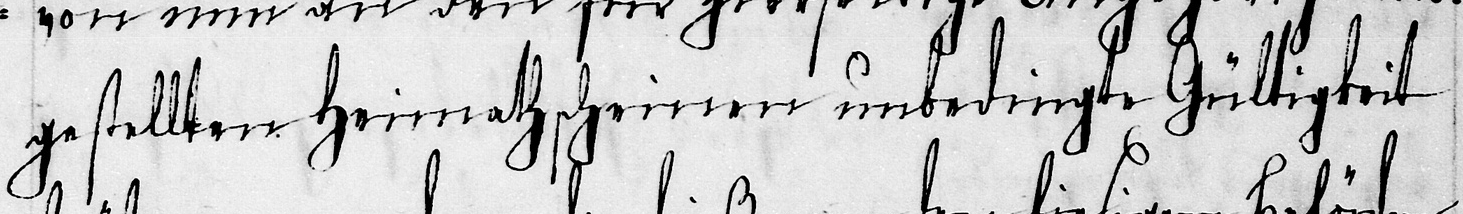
gestellten Heimathscheinen unbedingte Gültigkeit
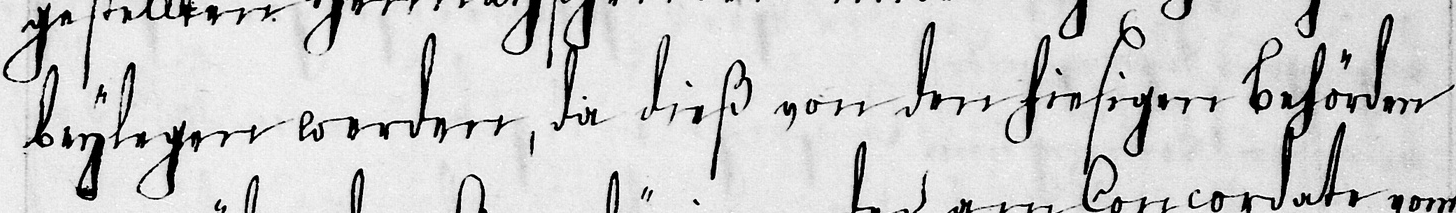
beylegen werden, da dieß von den hiesigen Behörden
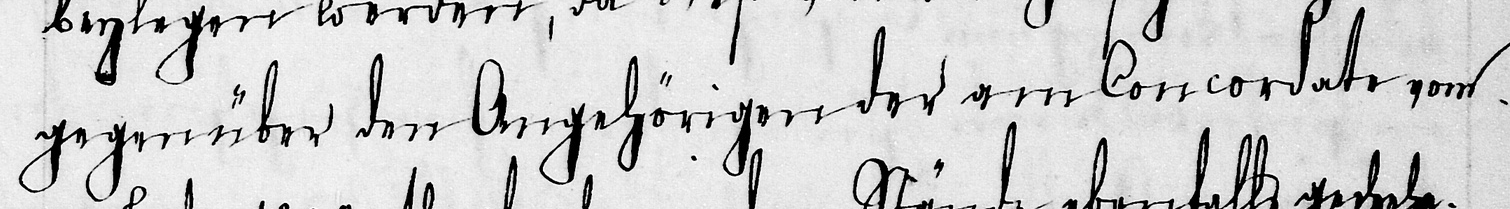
gegenüber den Angehörigen der am Concordate vom
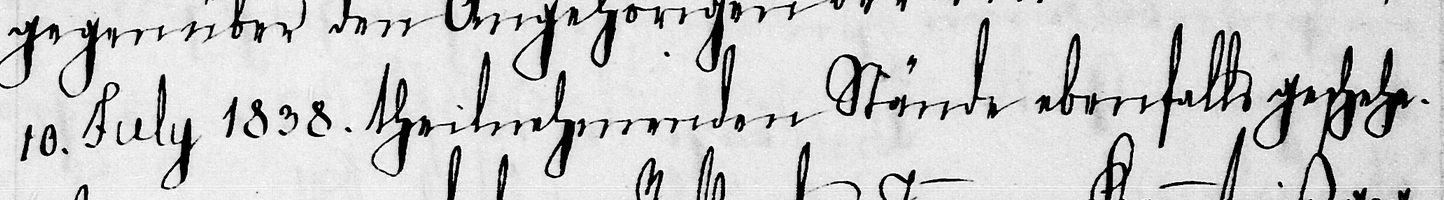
10. July 1838. theilnehmenden Stände ebenfalls geschehe.
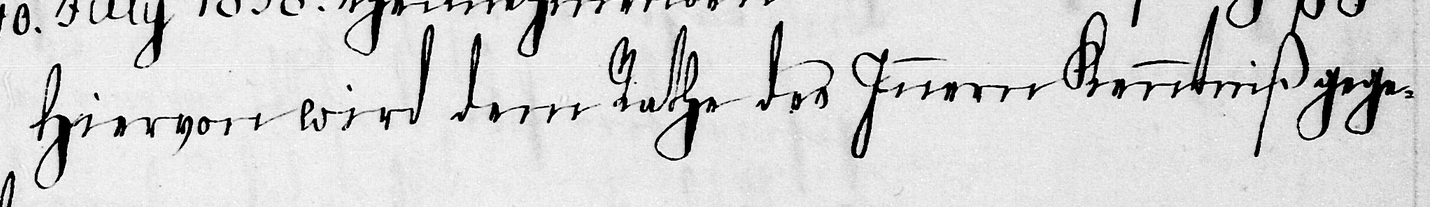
Hiervon wird dem Rathe des Innern Kenntniß gege¬
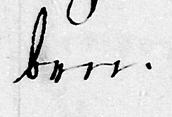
ben.
